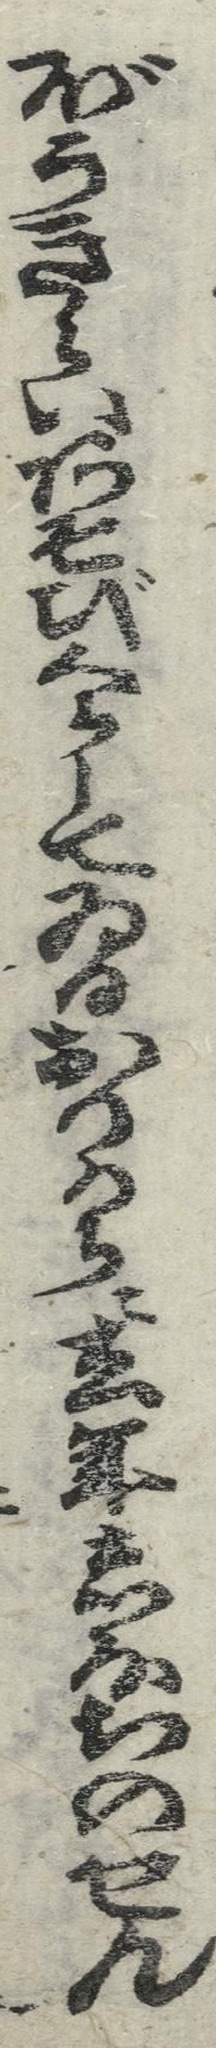ぼうきらいあそびくらしてゐるおりからに去年しなちのせん

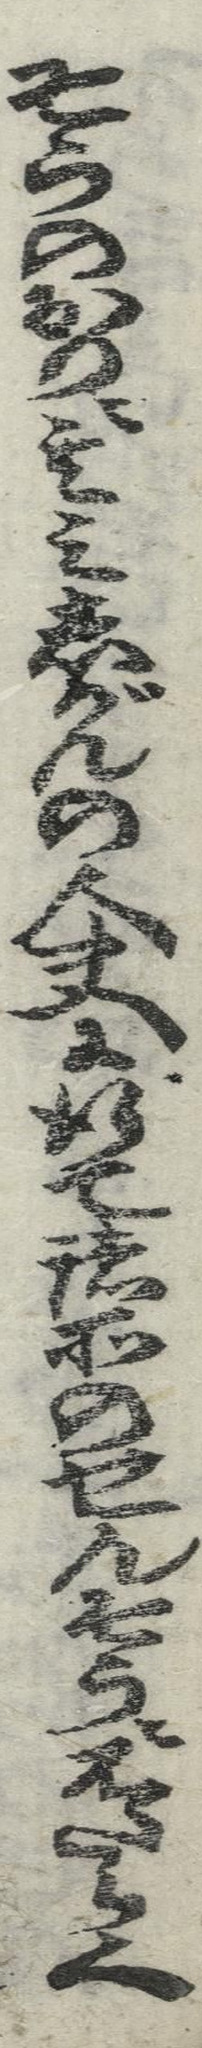そうのおりに其みしがんの人夫に行て諸所のせんそうにはたらく
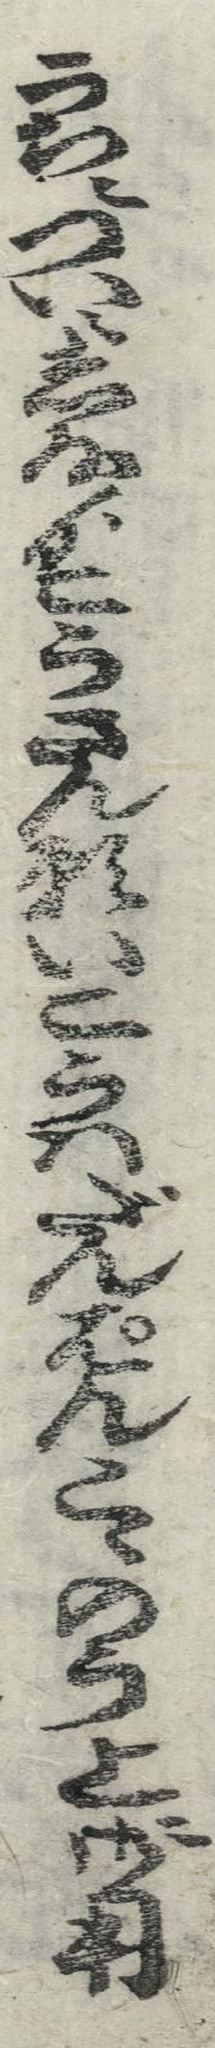うちについにしなゟこうさん願いこうはだんぱんこゝのう上に御用
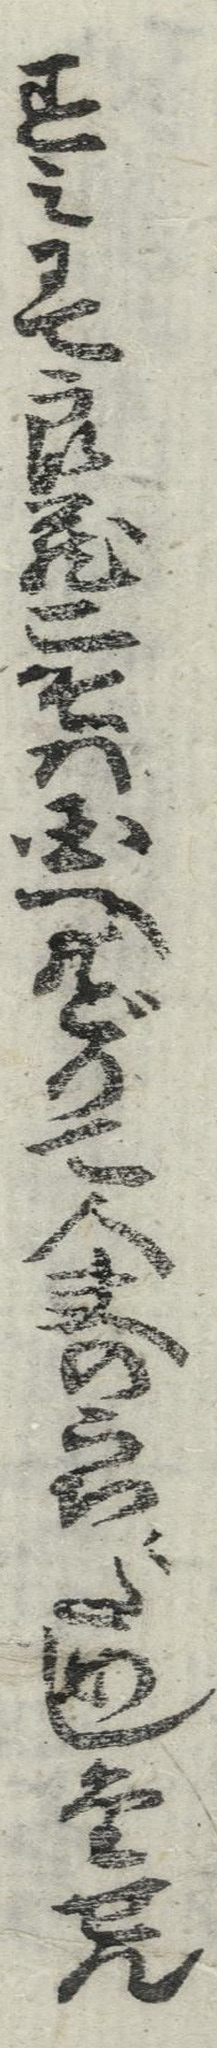すみにて良蔵こそは国へもどりて人夫のうちにためし金せん
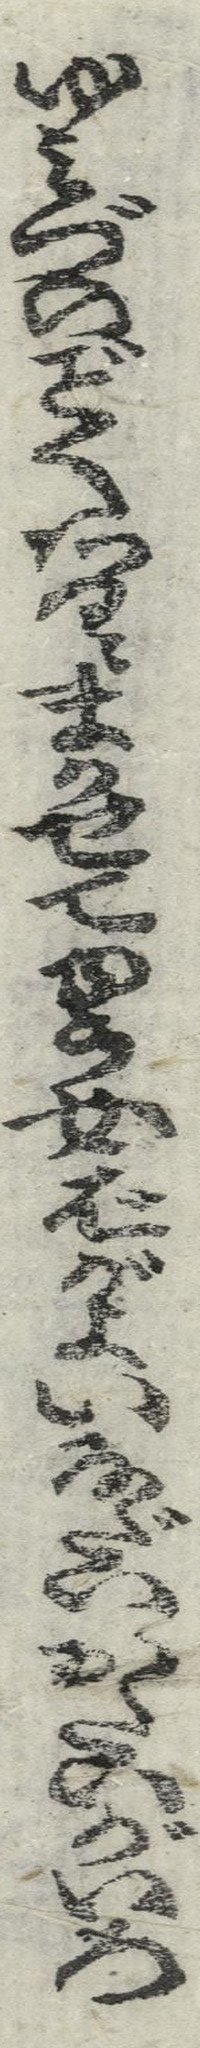ゆみづのごとくあるにまかせてゆう女ばがよいなだいおたいがいろ
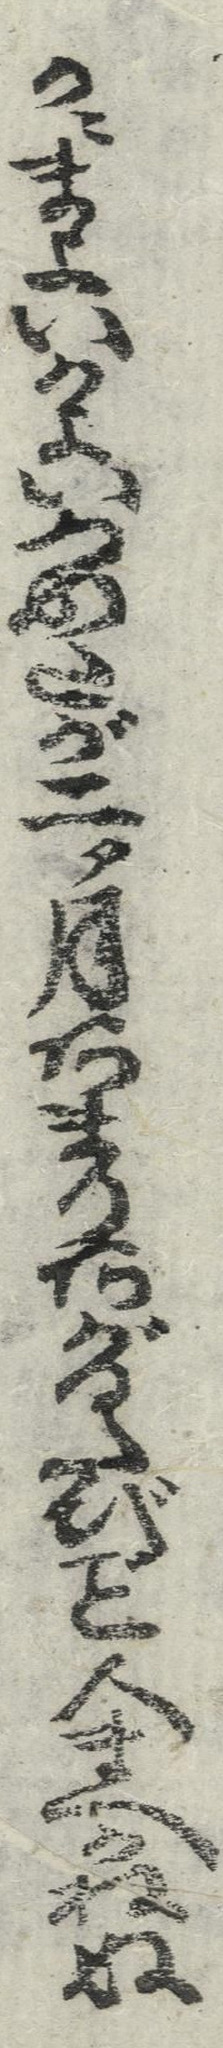かにまよいかよいつめたが二た月あまりあがるたびごと人まへかねぬ
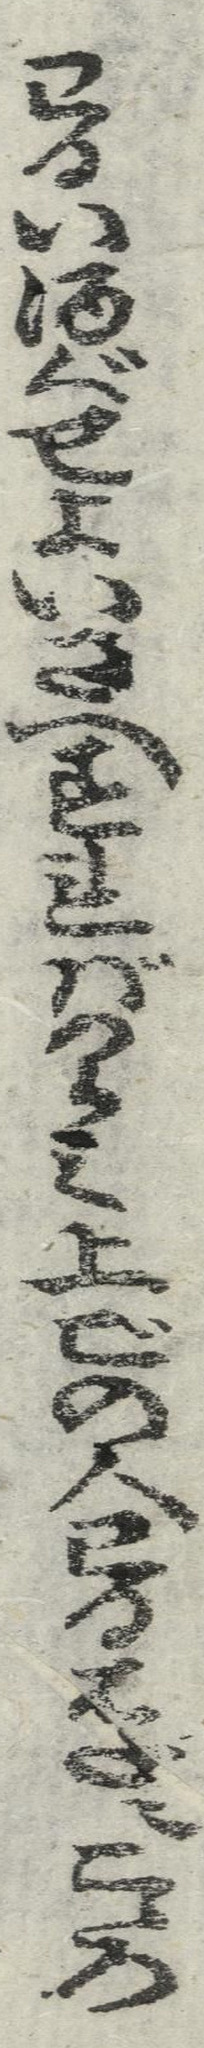わるい酒ぐせよいさへすればからみ上ごの人わるはねにこゝろ
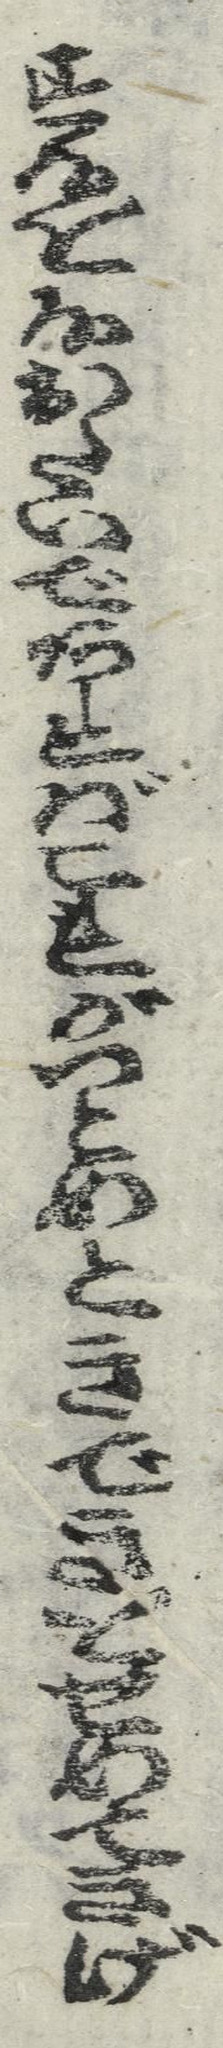すなをなおたいであればこれがつとめときできとせめてきげ
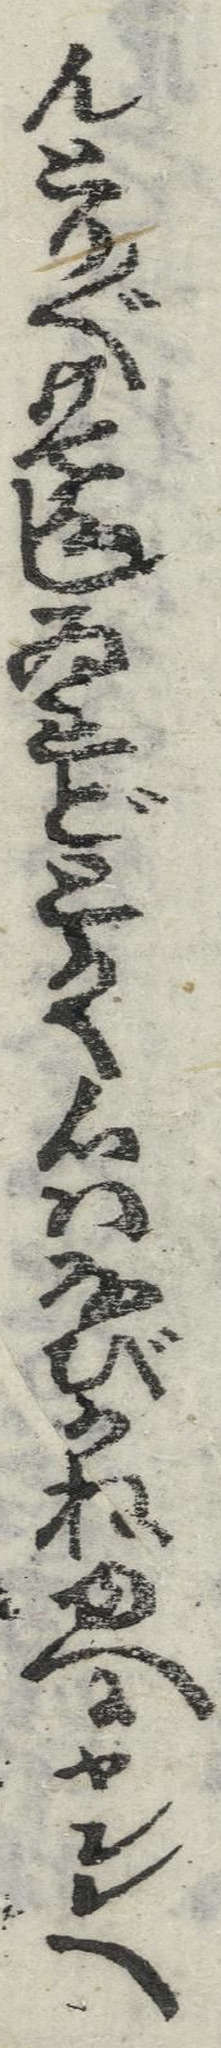んとり〴〵もてなしゐわどとかへ心はなぎかねゆへにヤンレへ
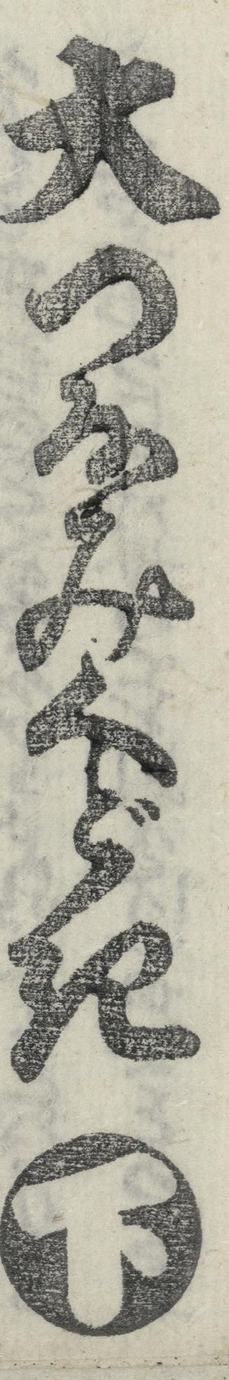大つなみくどき下
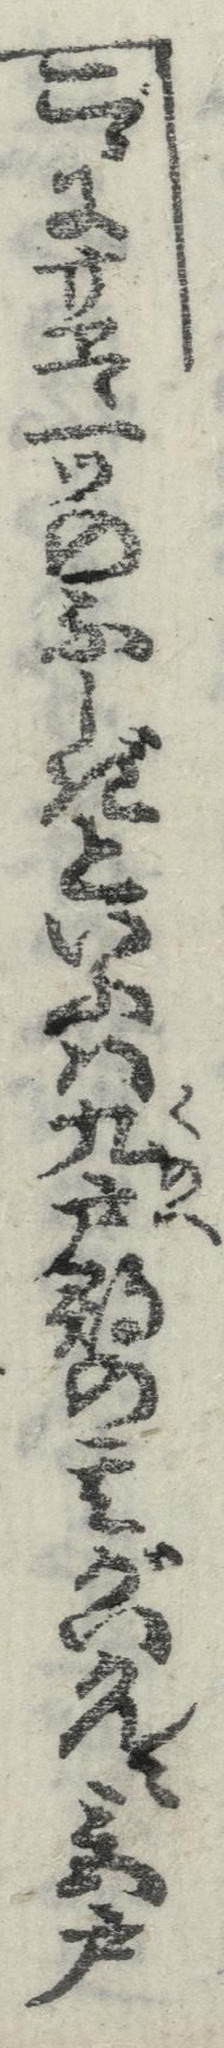〽こゝにサヱヽ一ツのふしぎといふは九戸郡の其がいかんに宮戸
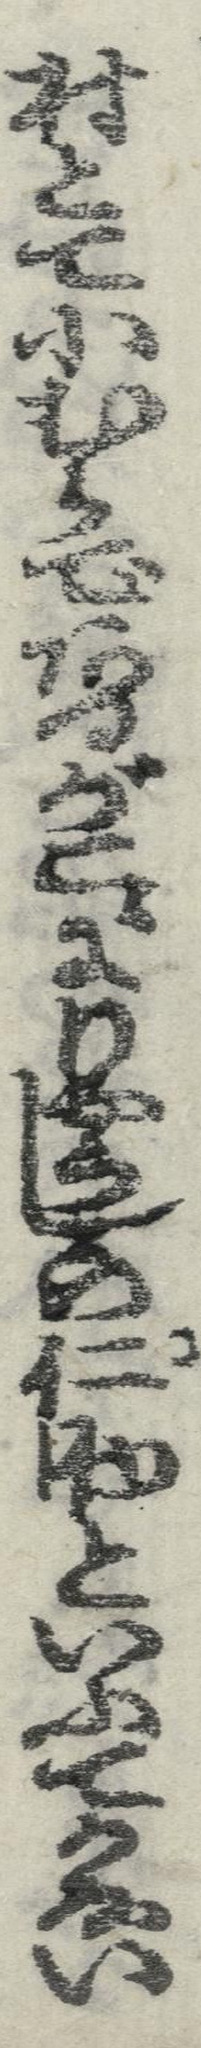村とて小むらであるがこゝにりやうしの仁助といふてかない
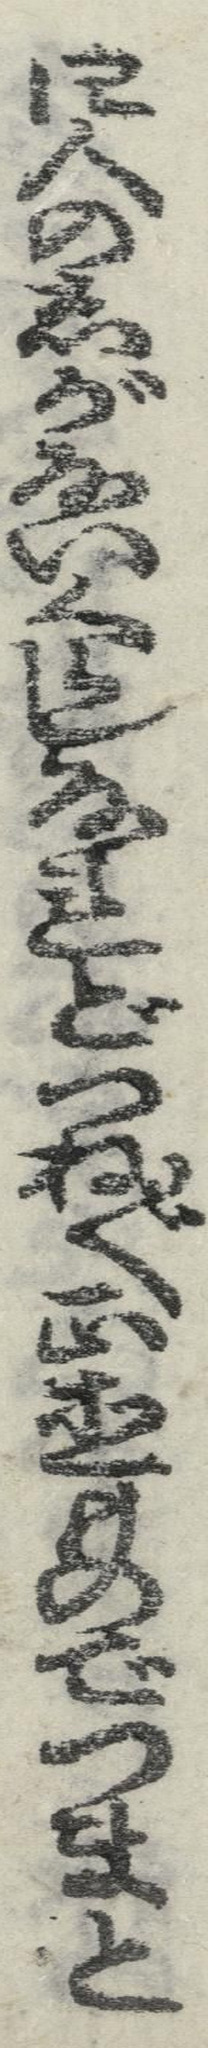四人のしがないくらしなれどつね〴〵正直ものでつまと
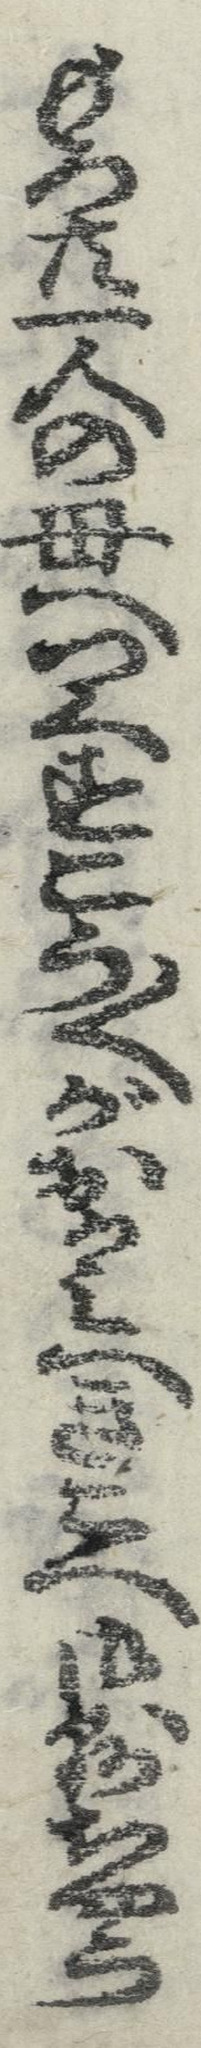もろ共一人の母へつくすこう〳〵がおかみへきこへ御県ちやう
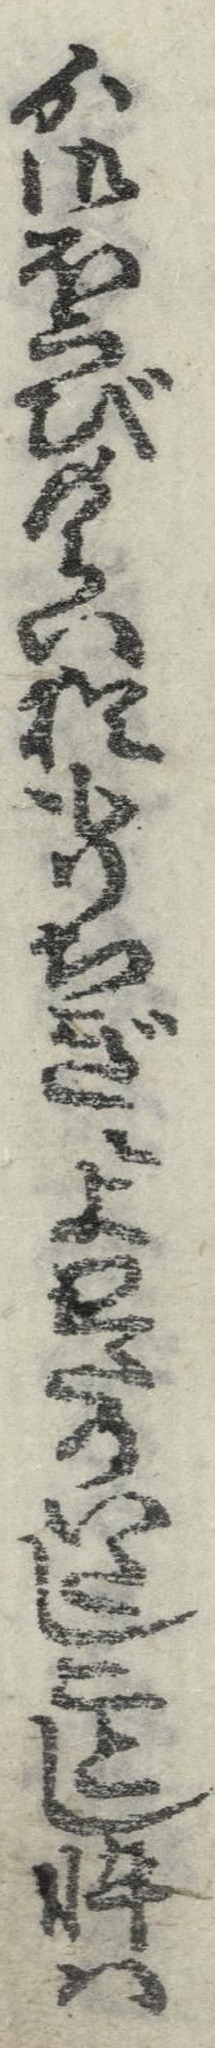ゟ御ほうびもらい猶もりちぎによわたりいたしことし忰は
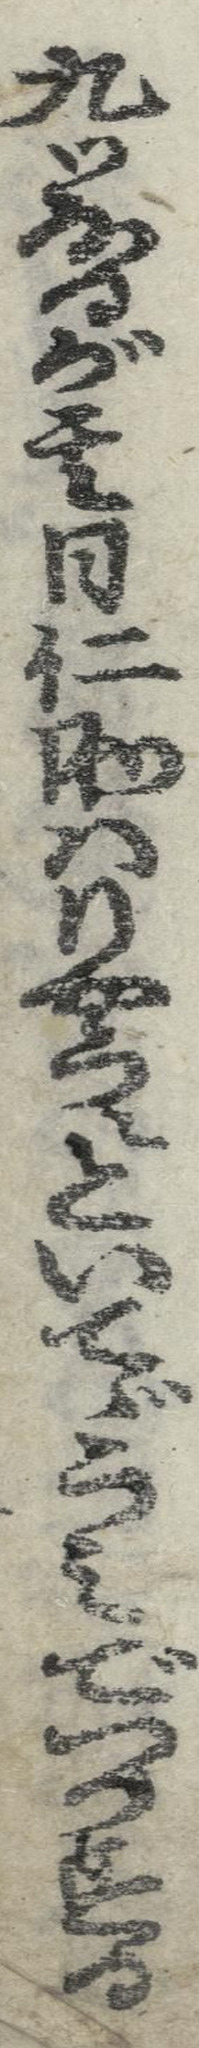九ツなるが其日仁助はりやうにといてゞうみでつりする
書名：奥州すじ大つなみおおあれくどき
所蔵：東京大学地震研究所図書室 Earthquake Research Institute Library, The University of Tokyo, JAPAN
